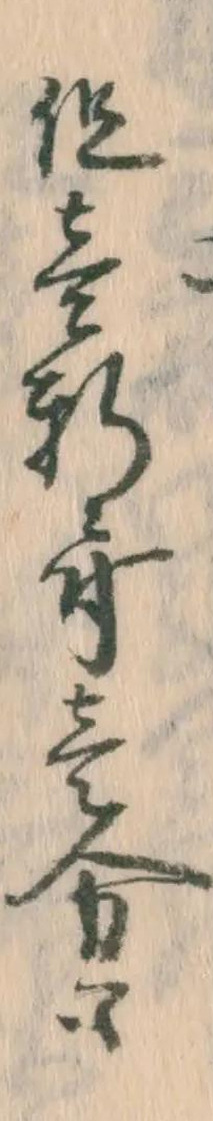但壱軒ニ付壱分ツヽ
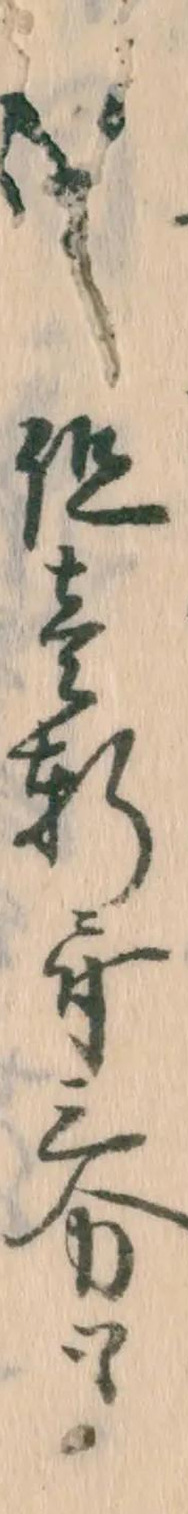但壱軒ニ付三分ツヽ
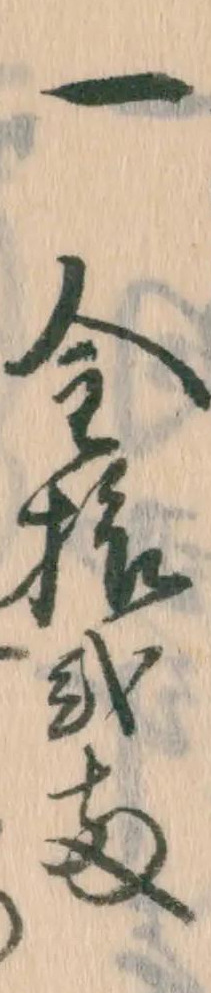一金拾弐両末寺
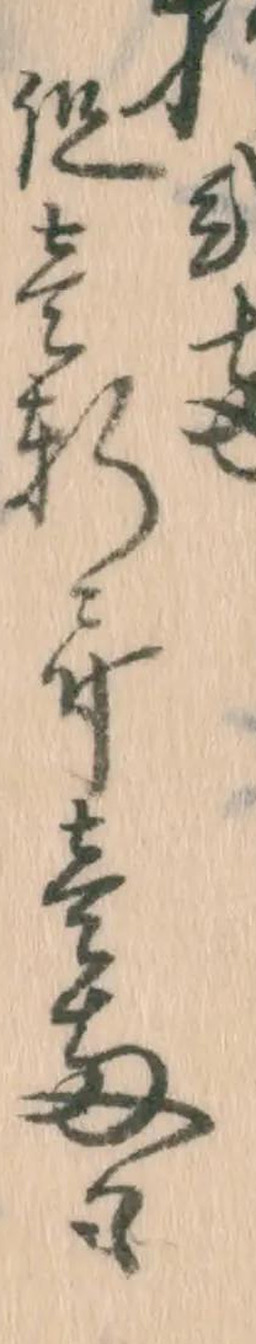但壱軒ニ付壱分ツヽ
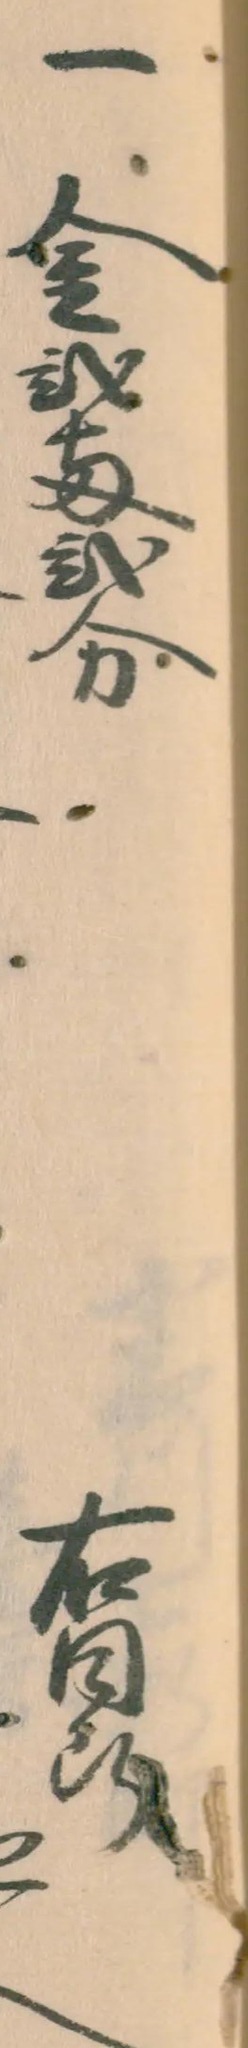一金弐両弐分右同断
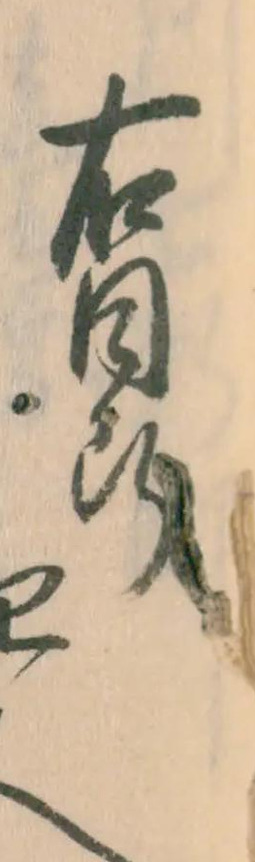右同断同院
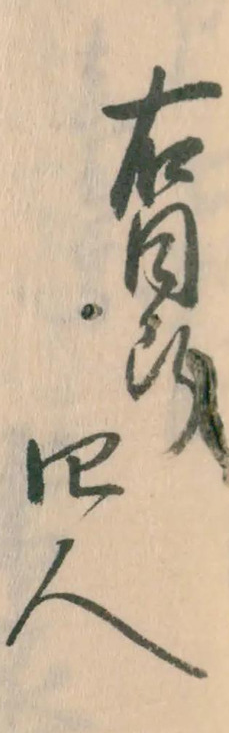右同断同院
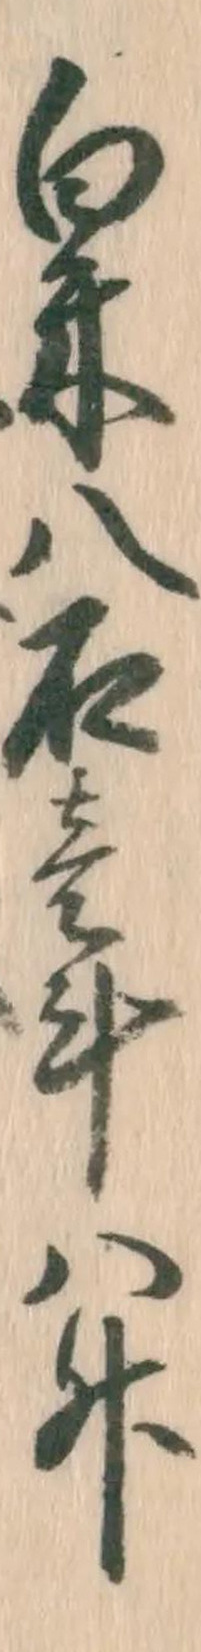白米八石壱斗八升
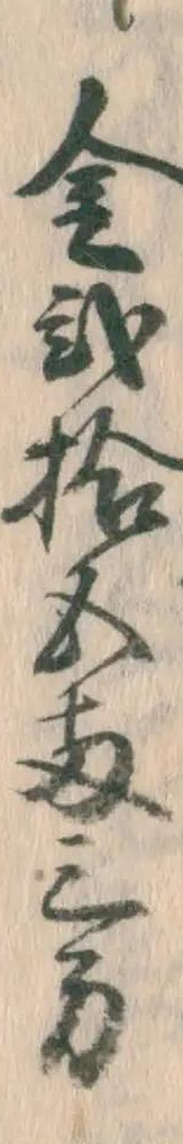金弐拾五両三分
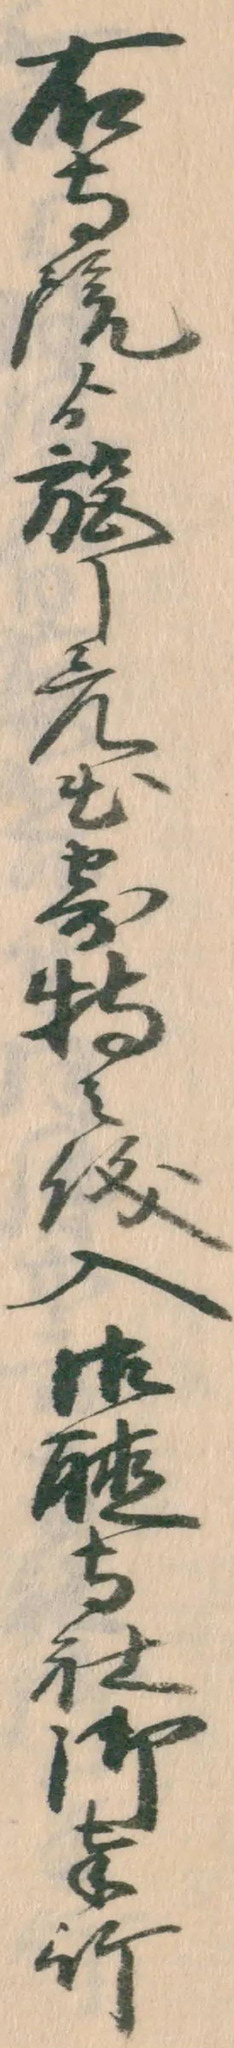右寺院ゟ施し差出奇特之儀入御聴寺社御奉行
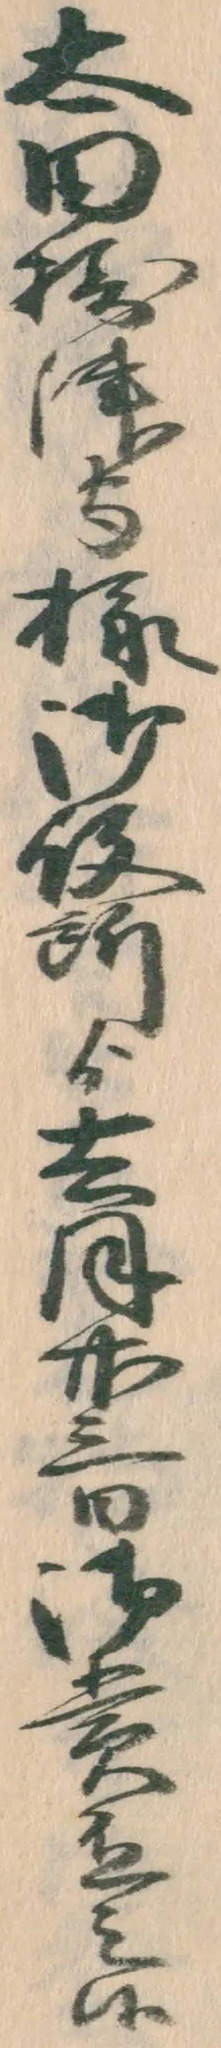太田摂津守様御役所ゟ去月廿三日御賞有之候

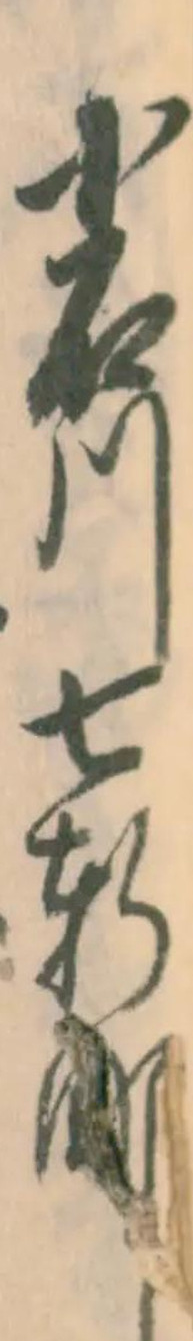小石川七軒町
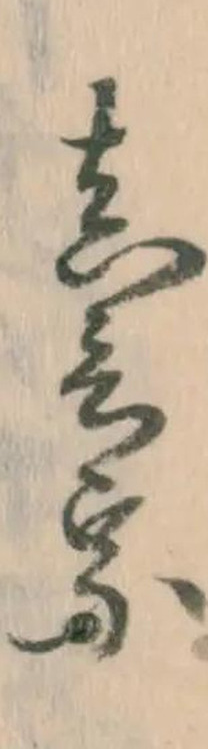真言宗
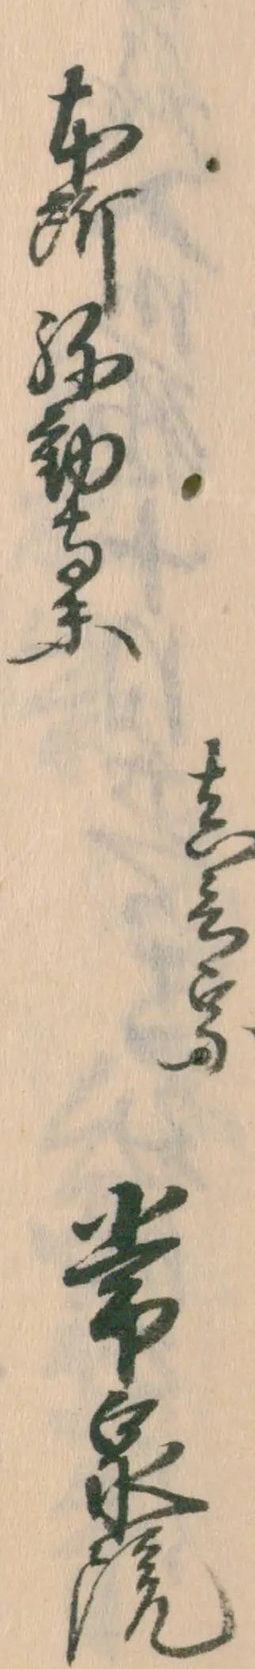本所弥勒寺末常泉院
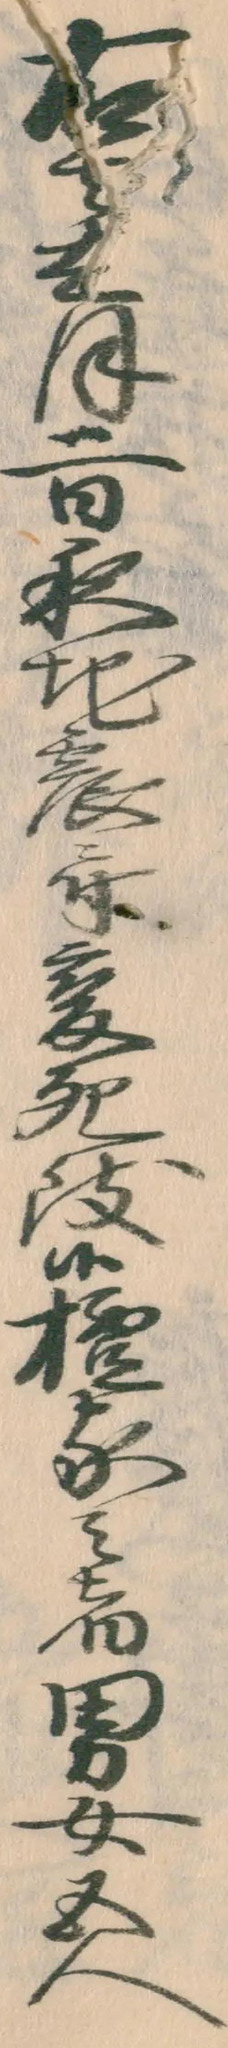右は去月二日夜地震ニ付変死致候檀家之者男女五人
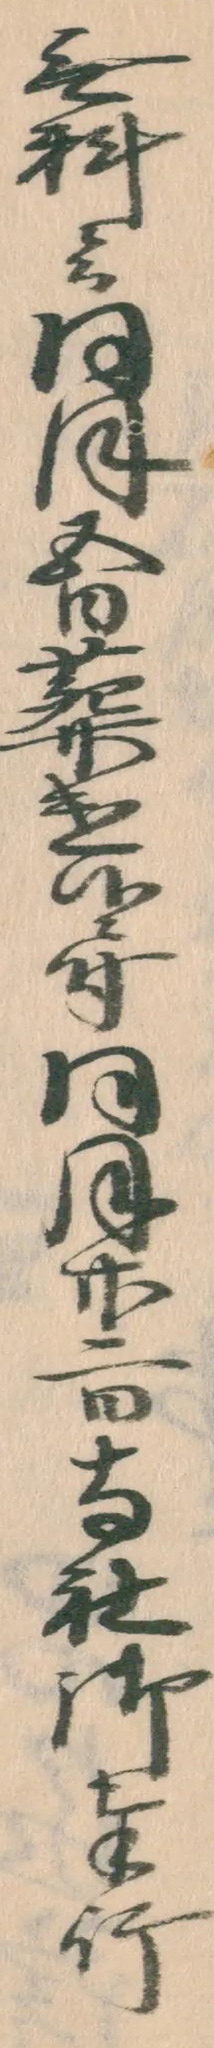無料ニ而同月五日葬遣候ニ付同月廿二日寺社御奉行
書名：武家方并寺院等ニテ施差出候一件
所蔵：国立国会図書館 National Diet Library, JAPAN
